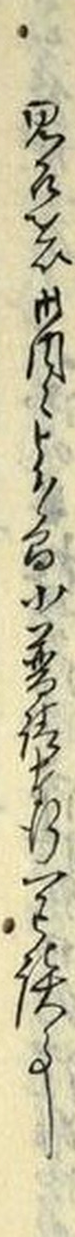思召を以御内々被下候間小普請奉行可被談事
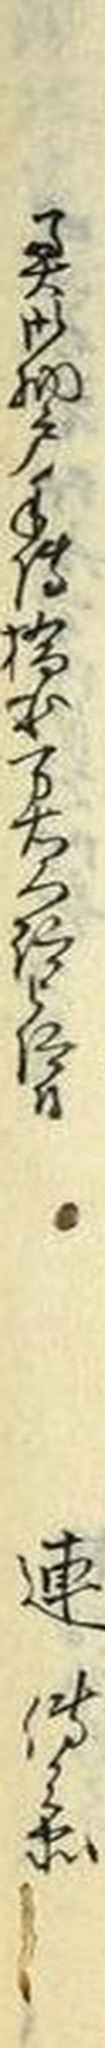奥御納戸手伝橋本万右衛門跡被仰付連伝兵衛
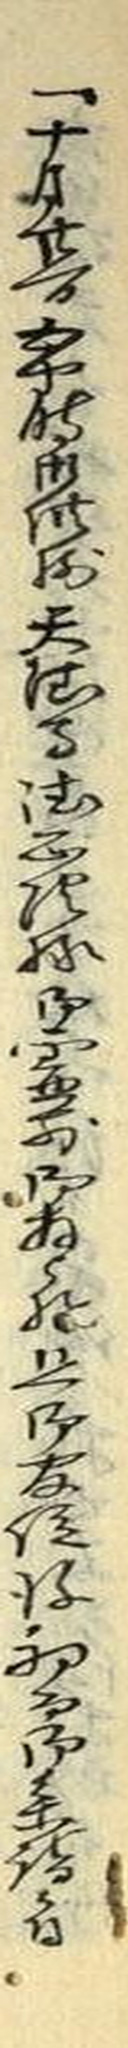一十月廿一日五半時御供揃天徳寺徳正院様御霊前御拝被遊且御官位後初而御参詣ニ付
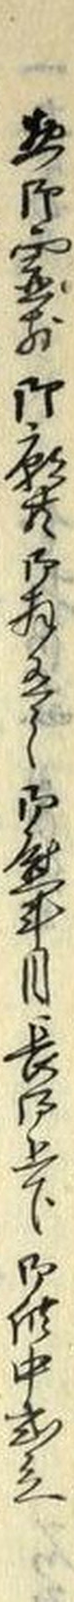惣御霊前御廟共御拝有之御熨斗目長御上下御供中式立
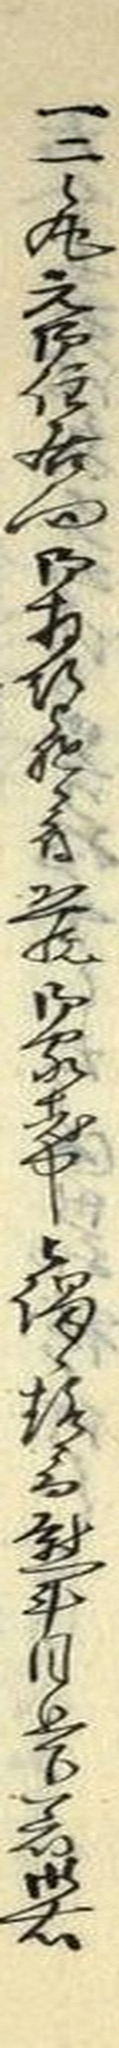一二ノ丸元御住居向御拝領被遊候ニ付恐悦御家老中被謁候趣ニ而熨斗目上下着御右
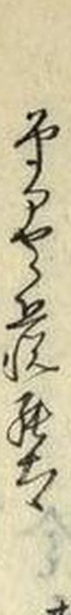筆部屋へ恐悦罷出候
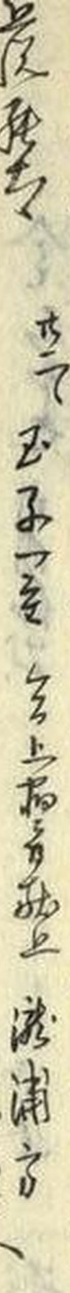廿二日玉子一重今日上宿ニ付献上滝浦方
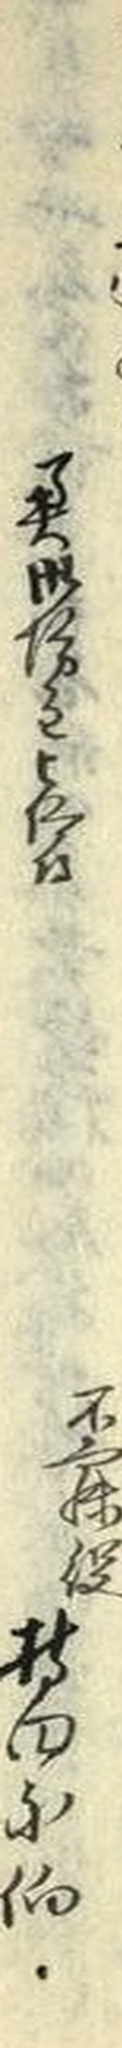奥御坊主被仰付不寝役村田永伯
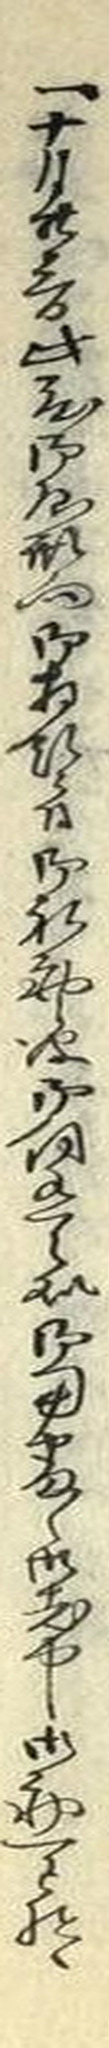一十月廿三日此度御屋形向御拝領ニ付御礼勤之儀御伺有之処御用番御老中御勤可被遊候
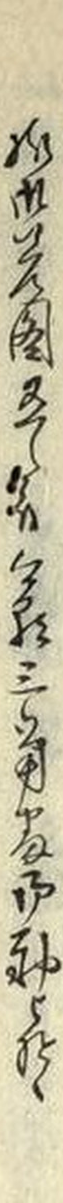様御差図有之ニ付今朝三御用番御勤被遊候
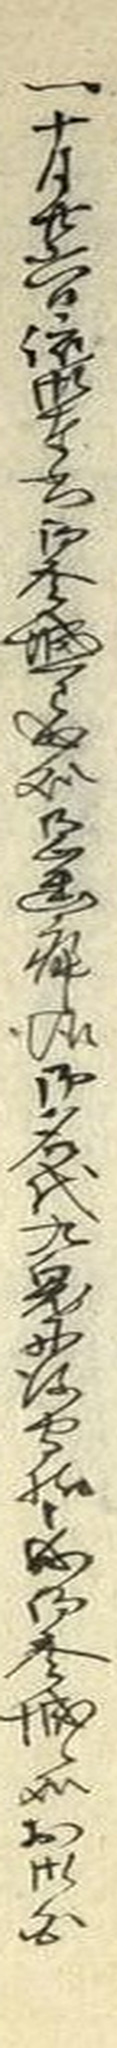一十月廿六日依御奉書御登城可被成処御歯痛之趣御名代九鬼丹波守様被成御登城候処於御白
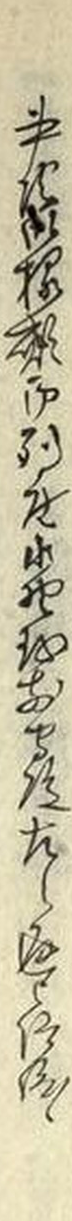書院御縁頬御列座水野越前守殿左之通被仰渡候御名
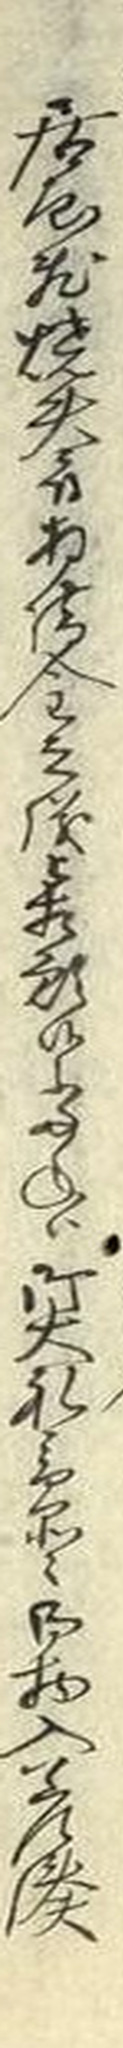居屋敷焼失ニ付拝借金之儀被相願候当年ハ御大礼ニ而品々御物入差湊
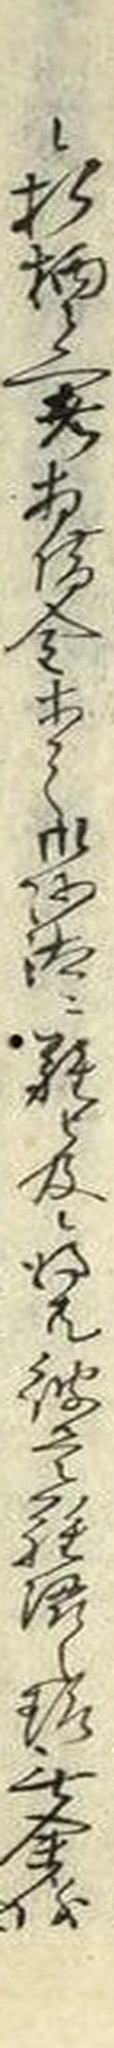候折柄ニ候へ者拝借金等之御沙汰ニ難被及候得共彼是難渋之趣無余儀被
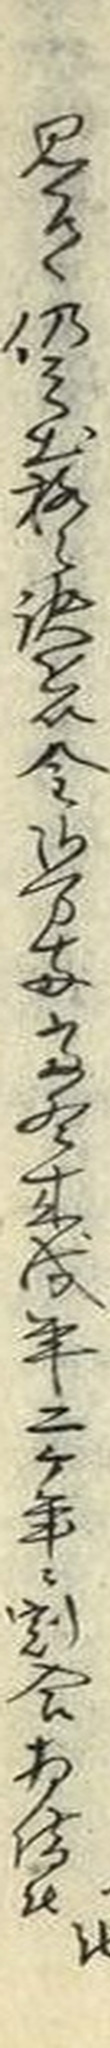思召候依之出格之訳を以金弐万両当冬来戌年二ケ年ニ割合拝借被
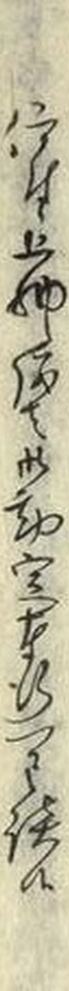仰付候上納之儀者御勘定奉行可申談候
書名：少傅日録抄（斉善付側向頭取日記、在府）
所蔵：福井県文書館 Fukui Prefectural Archives
